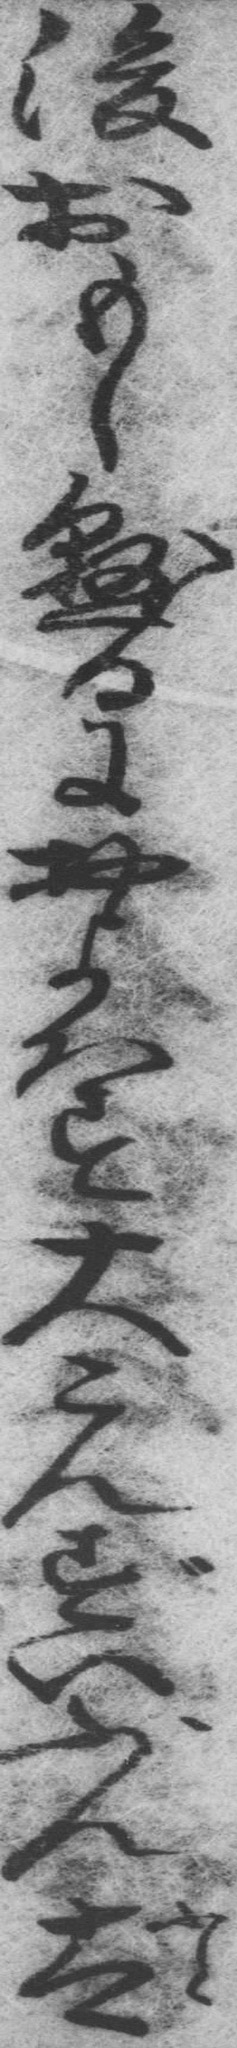後おもし懸るにおよはす大こんずいぶん太
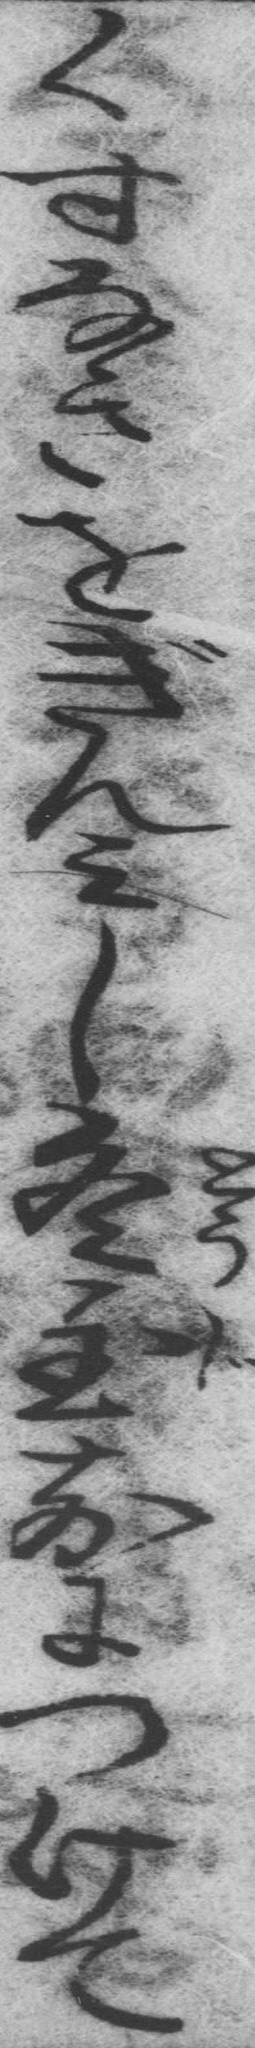く寸なきをぎんみし冬至前につけて
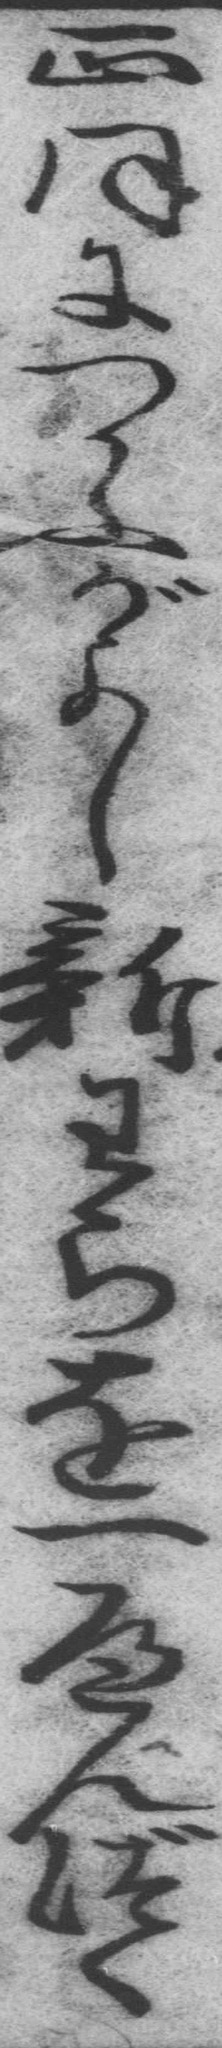正月につかふがよし新わらを一へんづゝ
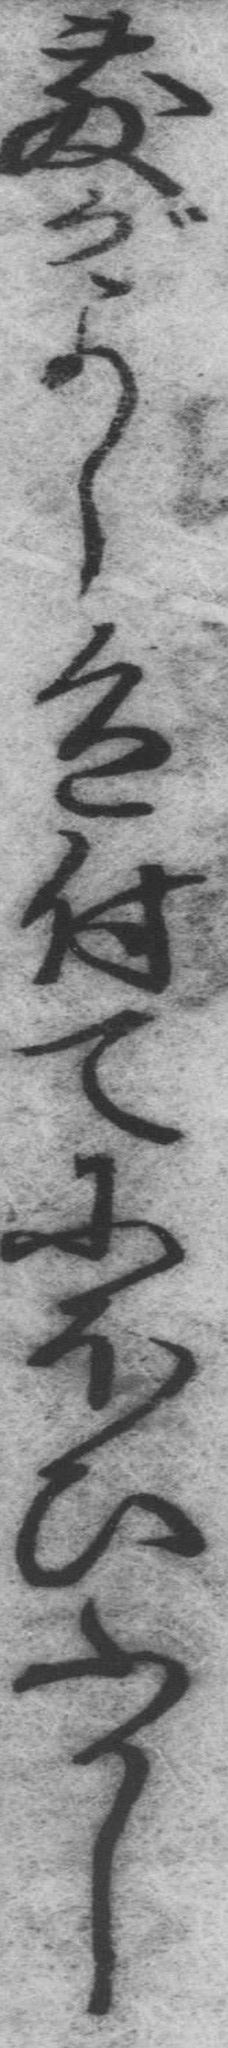敷がよし色付てにほひふかし

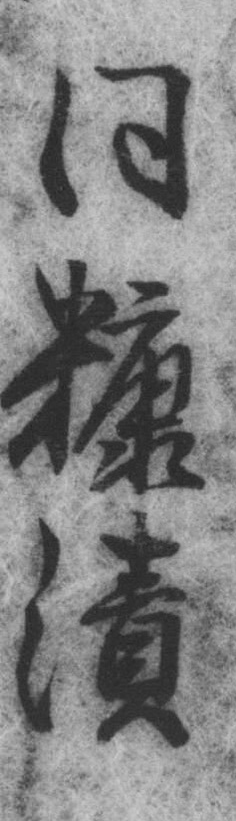同糠漬
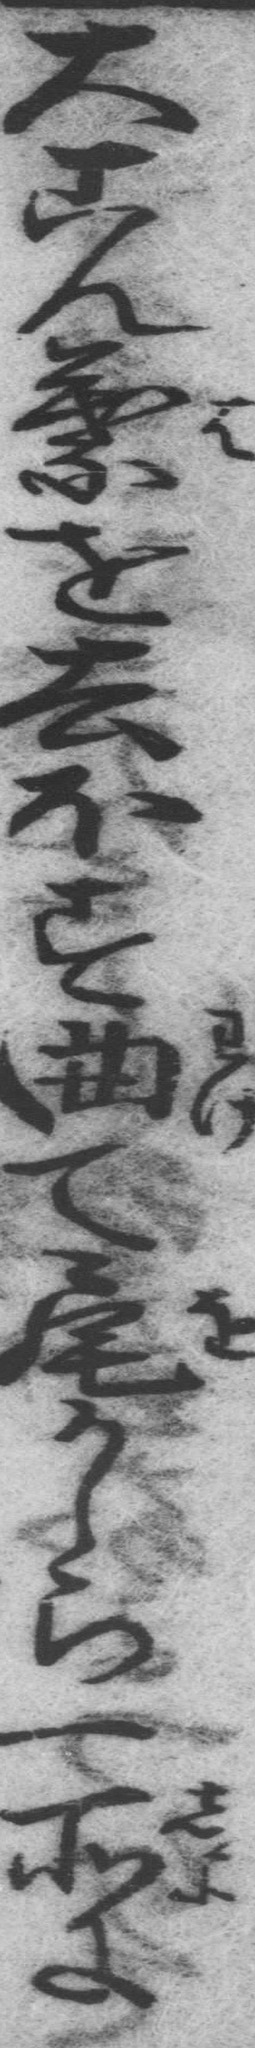大こん葉を去ほす曲て尾かしら一所に
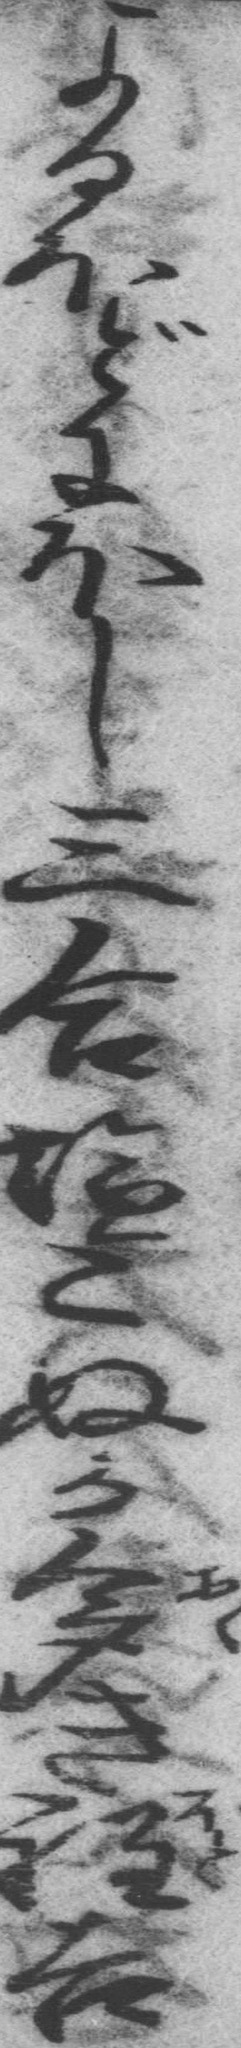よるほどにほし三合塩こぬか多き程吉
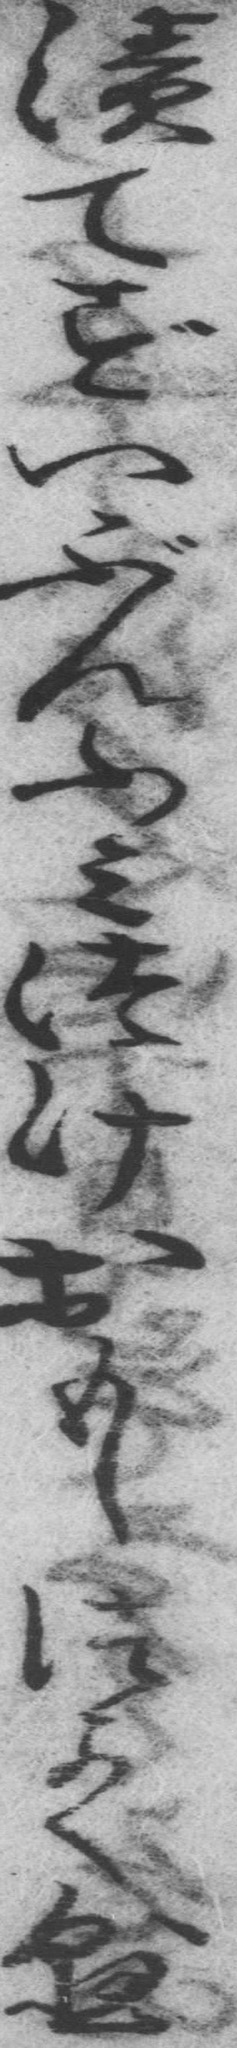漬てずいぶんふみつけおもしつよく懸
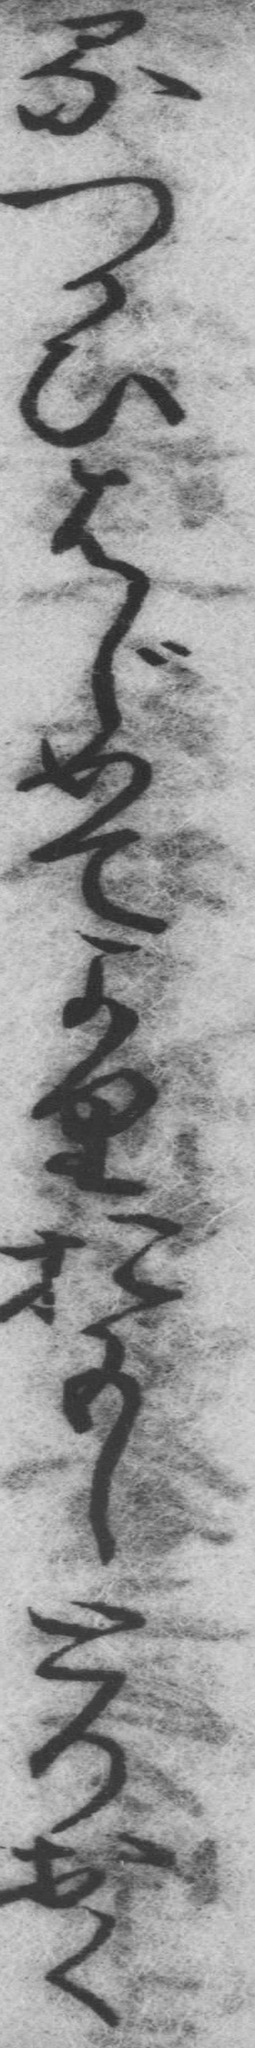るつかひはじめてよりおもしとりおく
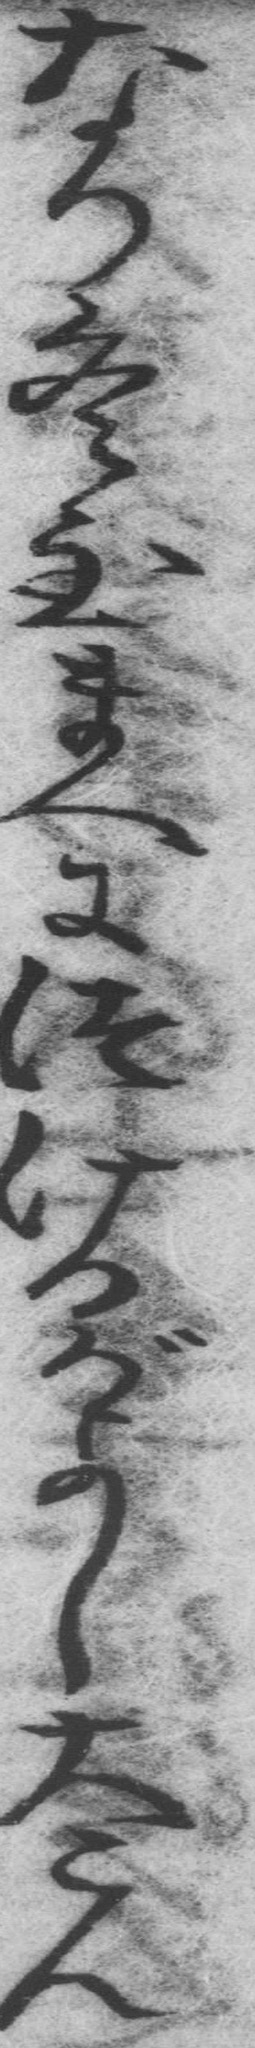なり冬至まへにつけるがよし大こん
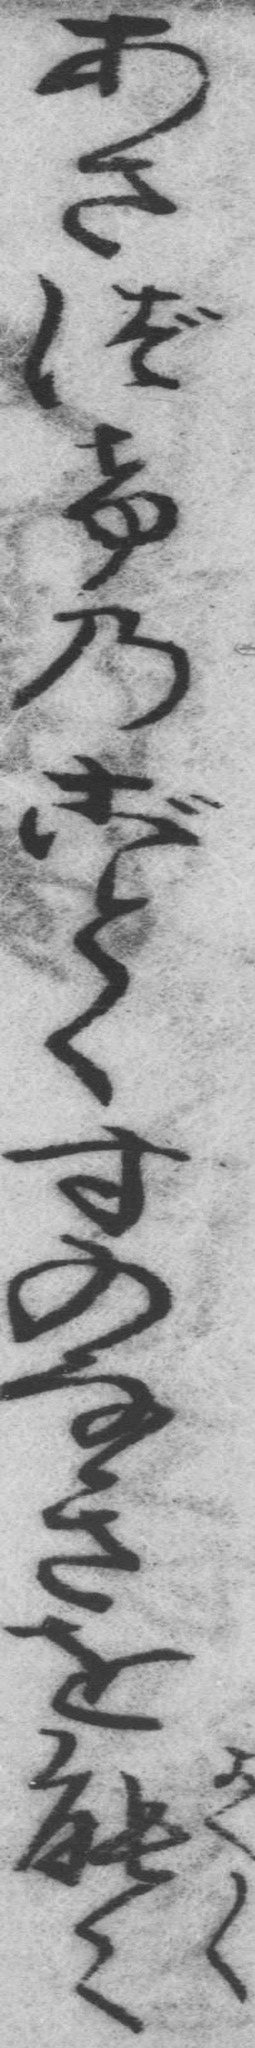あさづけのごとくすのなきを能々
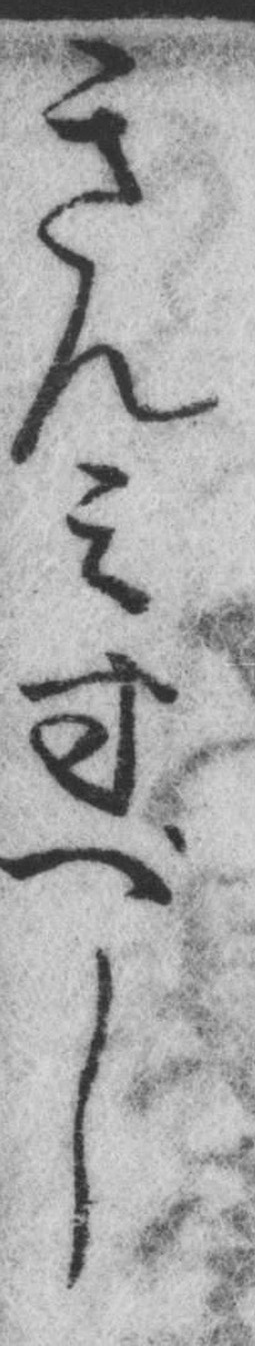きんみすべし
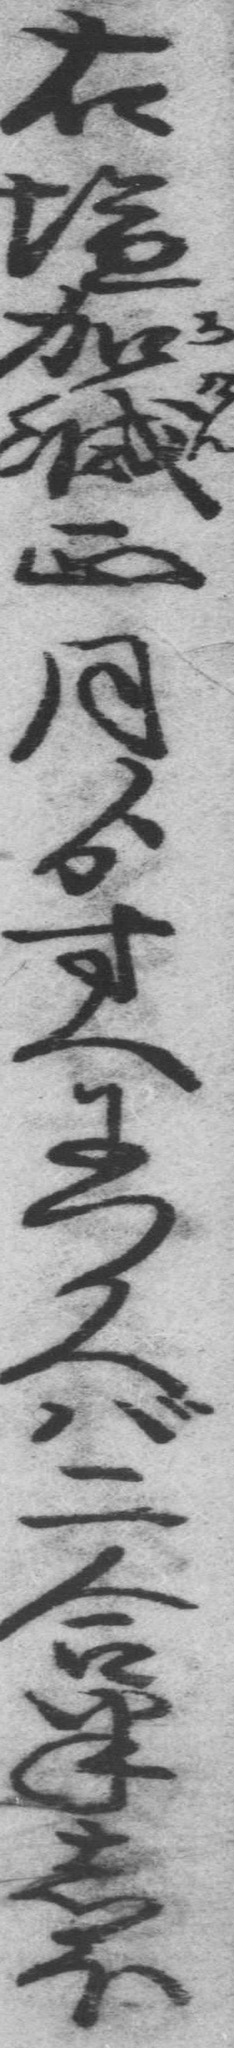右塩加減正月ゟすへにつかへば二合半しほ
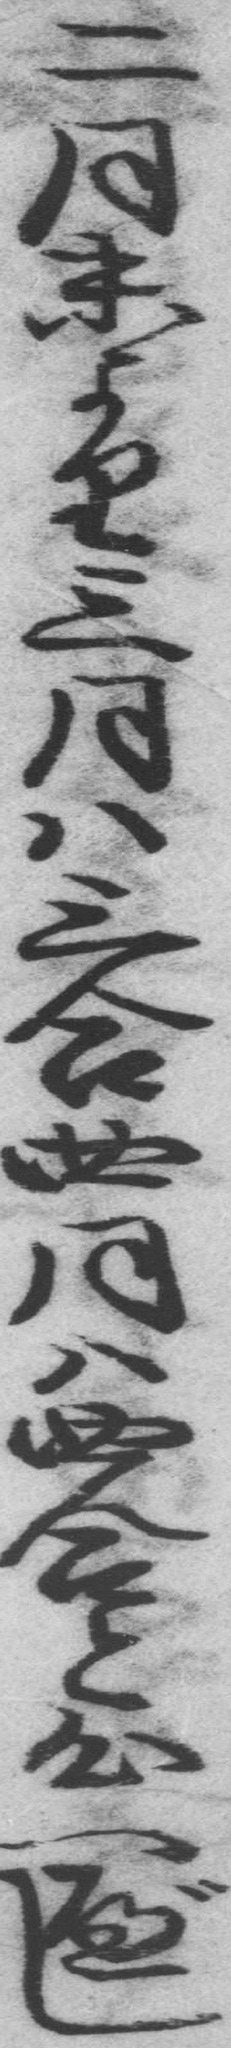二月末より三月は三合四月は四合と心へべし
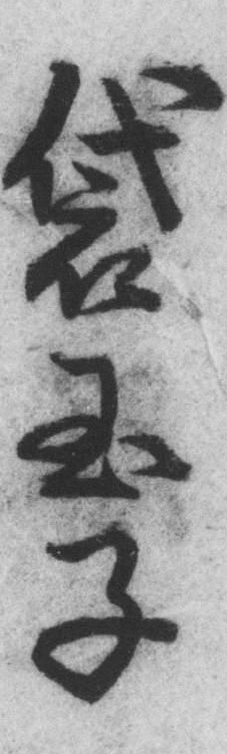袋玉子
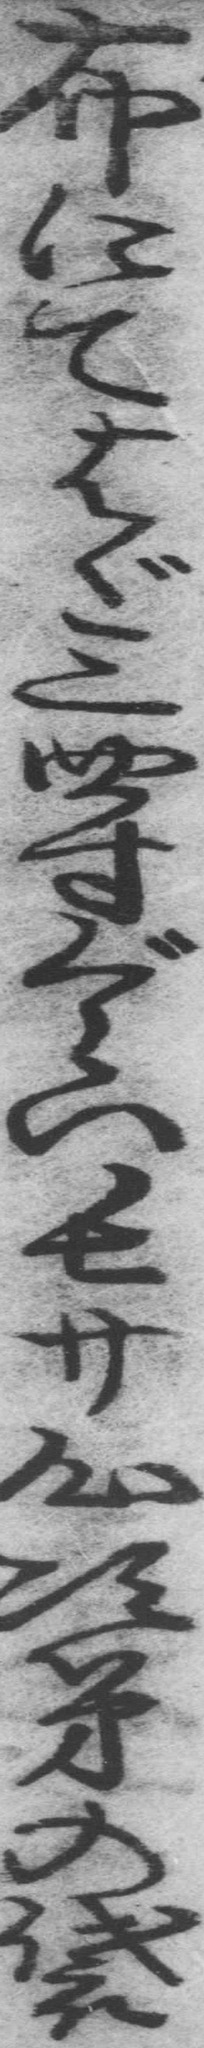布にてはゞ三四寸ぐらい長さ心次第の袋
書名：料理山海郷
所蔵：大阪府立大学学術情報センター 国文学研究資料館
